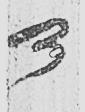乃
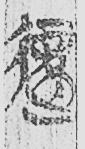復
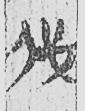伐
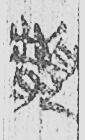顝
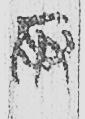取
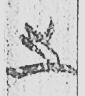之
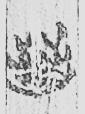晉
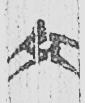文
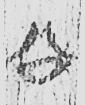公
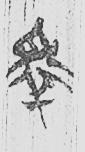卒B
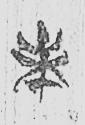未
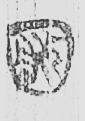{囗爿歺}
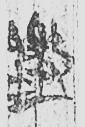襄
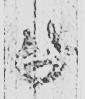公
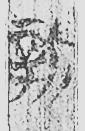新
